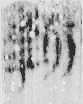新
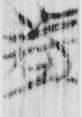者（都）
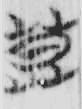莫
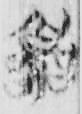囂
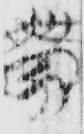○（勝）
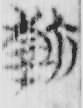新
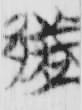都
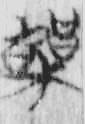桑
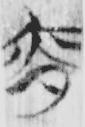夜
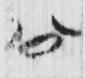公
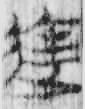達
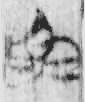爲
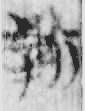新
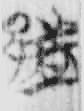都
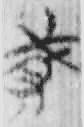貸
